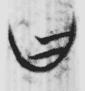曰
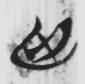臣
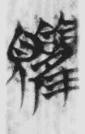{見雚}
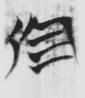於
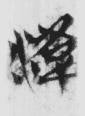湋
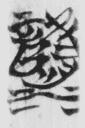{䇂𠂤欠臼水}
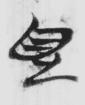見
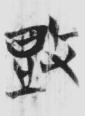{豆攴}
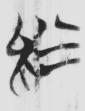{鳥八二}
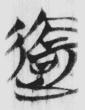{辶奇}
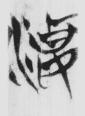淒
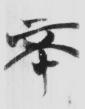不
